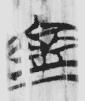齊
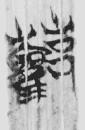{艸雚邑}
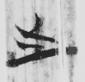之
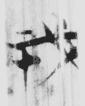戎
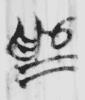爲
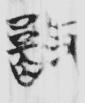{育攴}
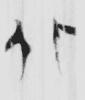北
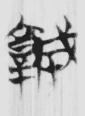{享成}
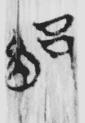{邑龴口人}
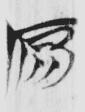原
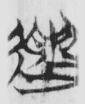遺
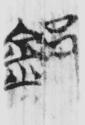{金阝}
